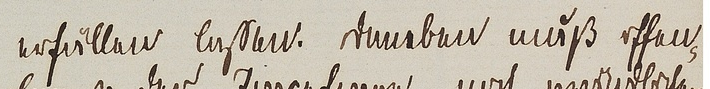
erfüllen lassen. Daneben muß offen-
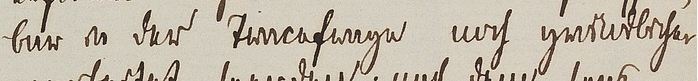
bar in der Tracefrage noch gründlicher
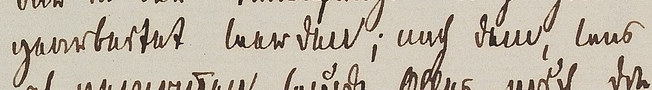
gearbeitet werden; nach dem, was
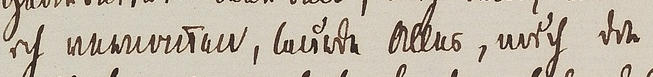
ich vernommen, würde Alles, auch die
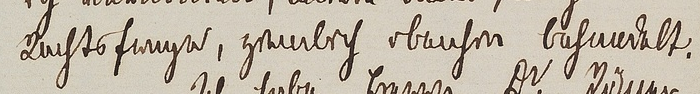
Rechtsfrage, ziemlich obenhin behandelt.
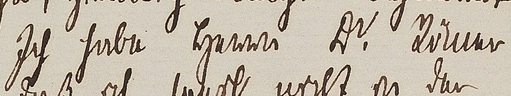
Ich habe Herrn DrRömer
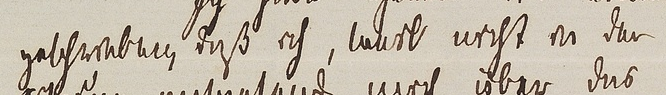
geschrieben, daß ich, weil nicht in der
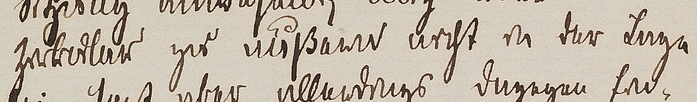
Zirkular zu äußern nicht in der Lage
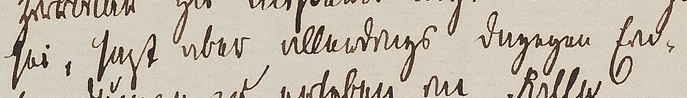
sei, sezt aber allerdings dagegen Ein-
